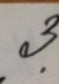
3
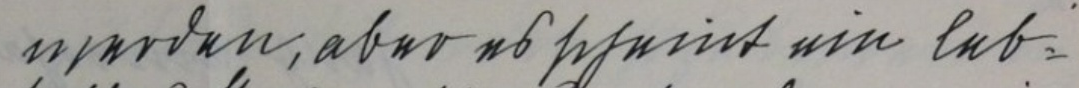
werden, aber es scheint ein leb
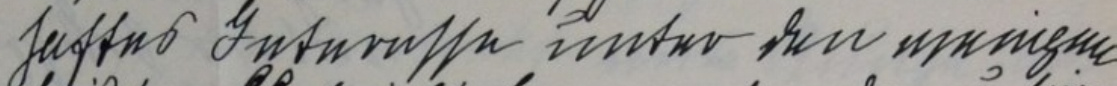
haftes Interesse unter den wenigen
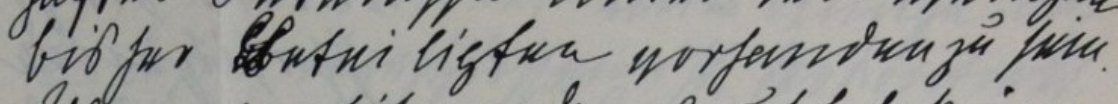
bisher Beteilitgen vorhanden zu sein.
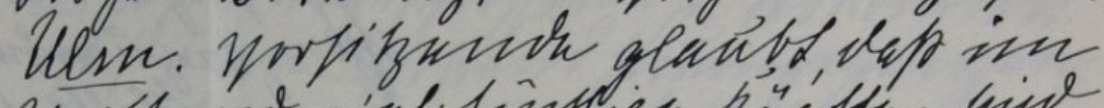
Ulm Vorsitzedne glaubt, da0 im
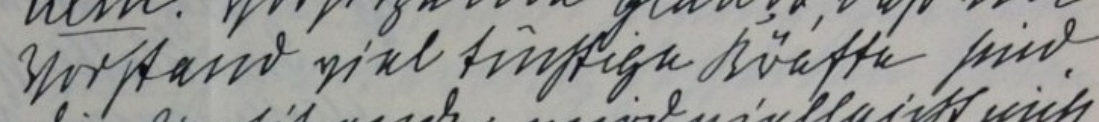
Vorstand viel tüchtige Kräfte sind.
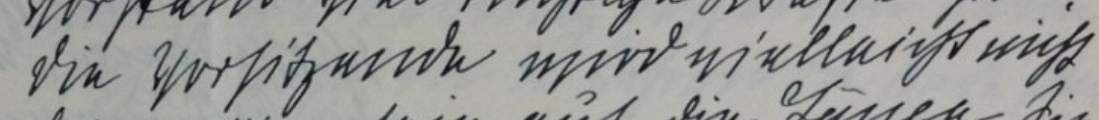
Die VOrsitzende wird vielleicht nicht
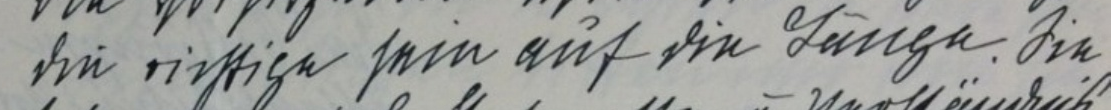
die richtige sein auf die Länge. Sie
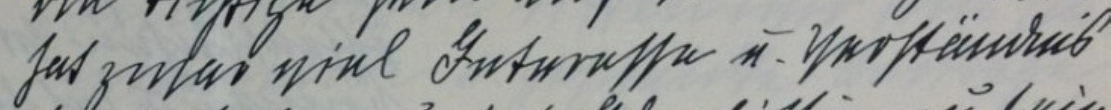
hat zwar viel Interesse u. Verstänkeit
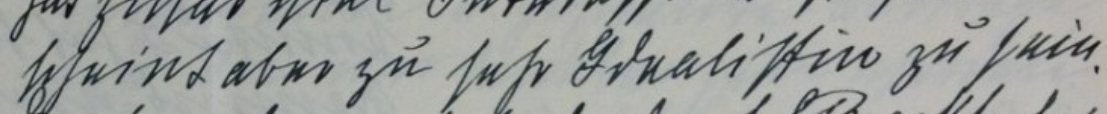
scheint aber zu sehr Idealistin zu sein.
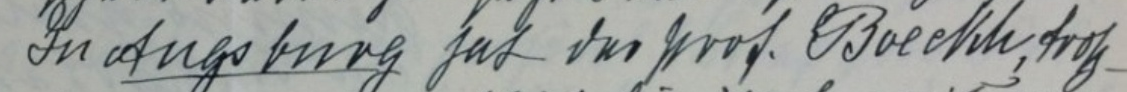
In Augsburg hat der Prof. Boectch trotz
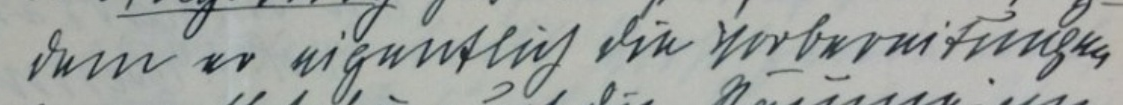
dem er eigentelich die Vorbereitungen
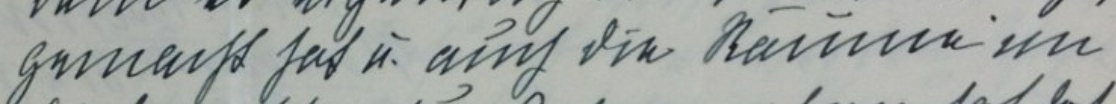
gemcht hat u. auf die Räume im
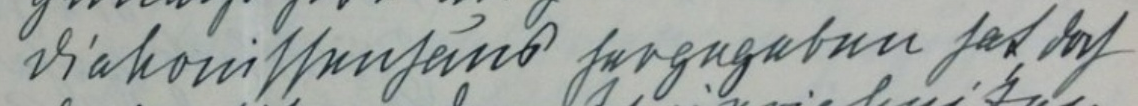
Diakonissenhaus vergeben hat doch
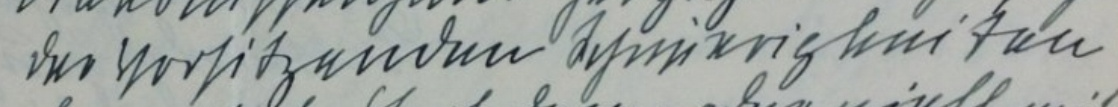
der Vorsitzenden Schwierigkeiten
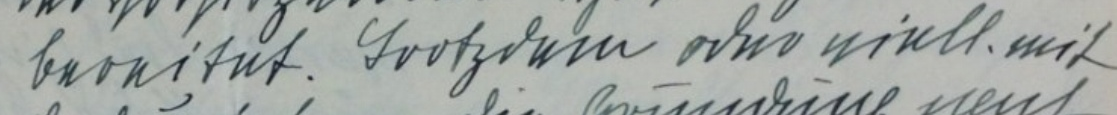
bereitet. Trotzdem ider viell. mit
